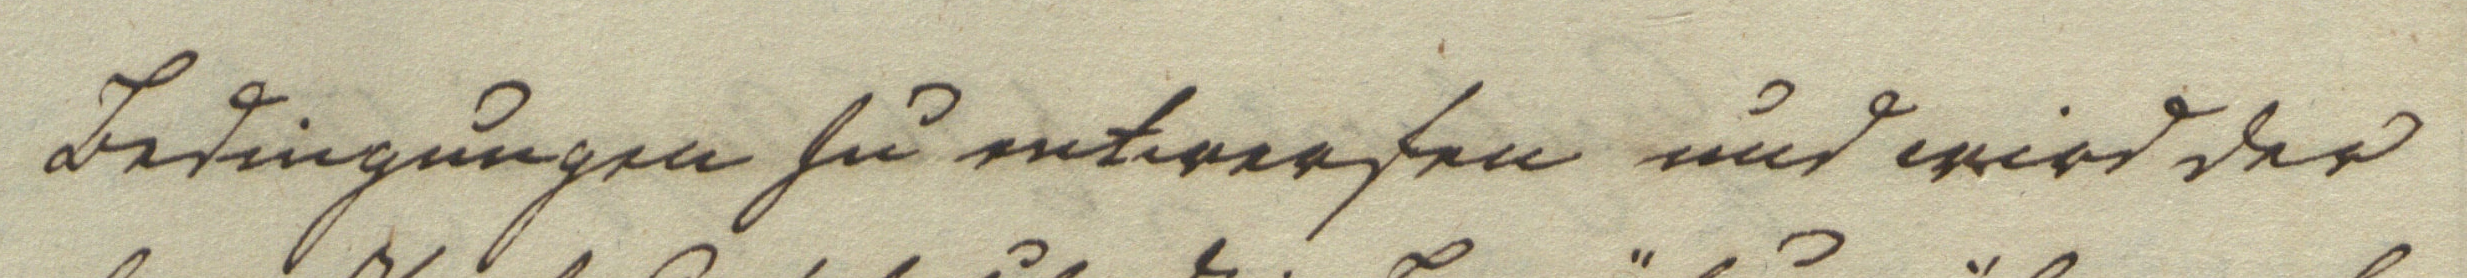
Bedingungen zu entwerfen und wird der
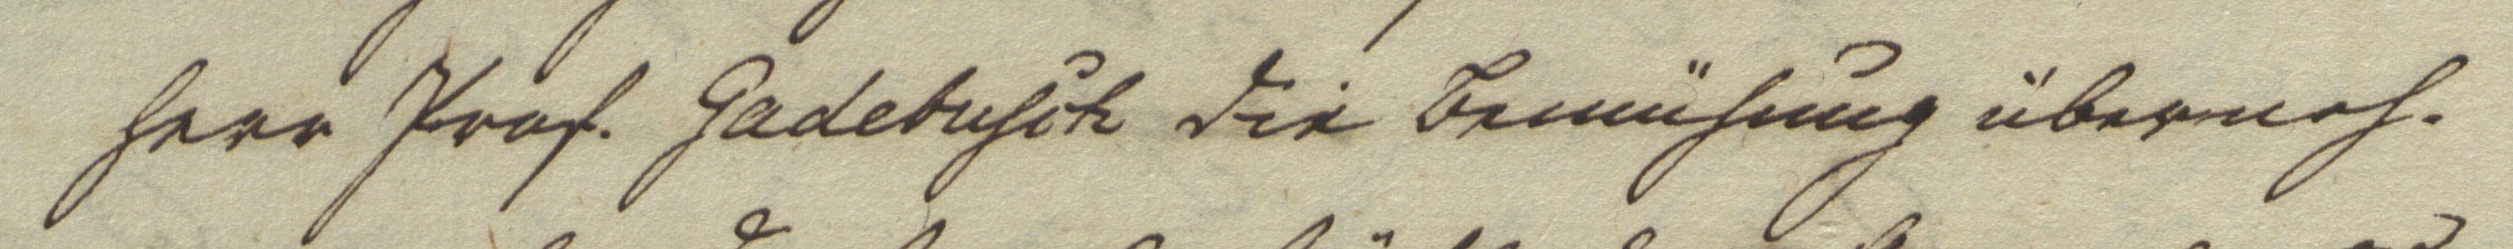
Herr Prof. Gadebusch die Bemühung überneh¬
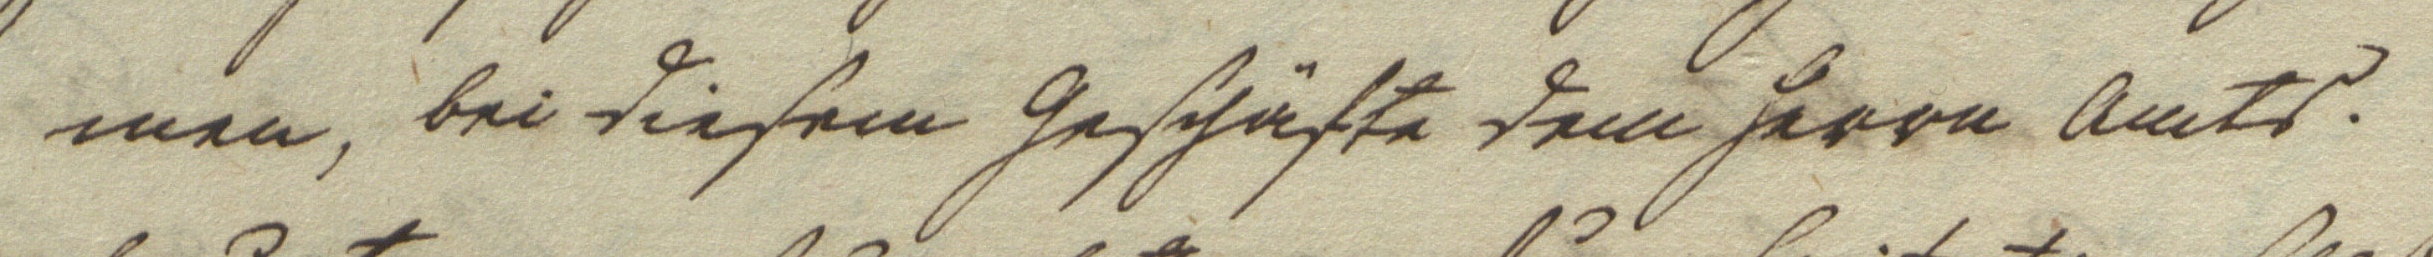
men, bei diesem Geschäfte dem Herrn Amts¬
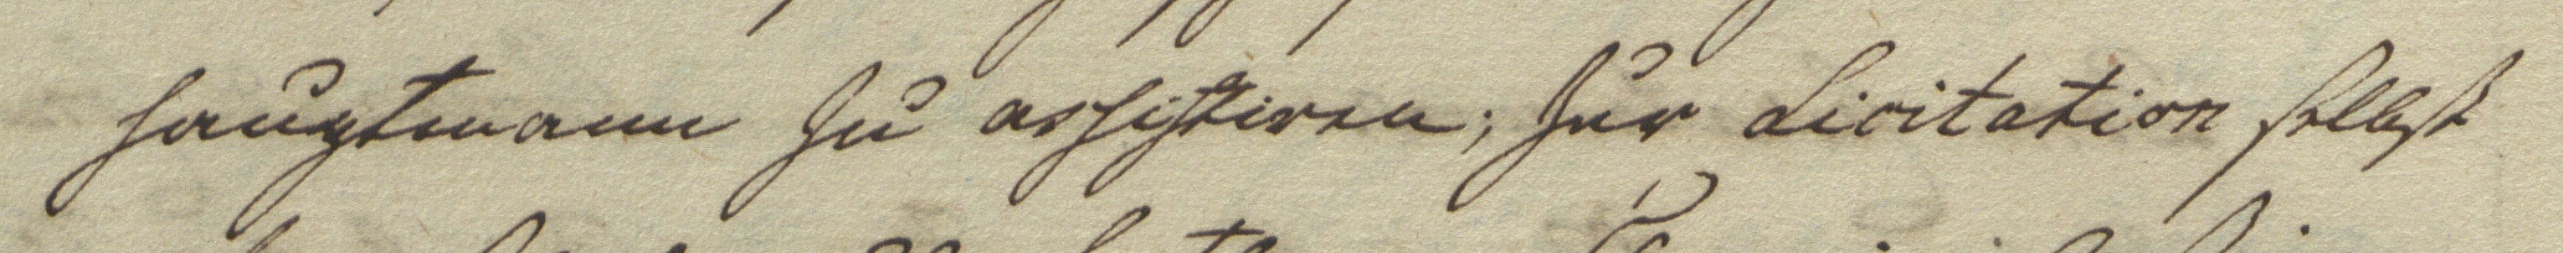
hauptmann zu assistiren; zur Licitation selbst
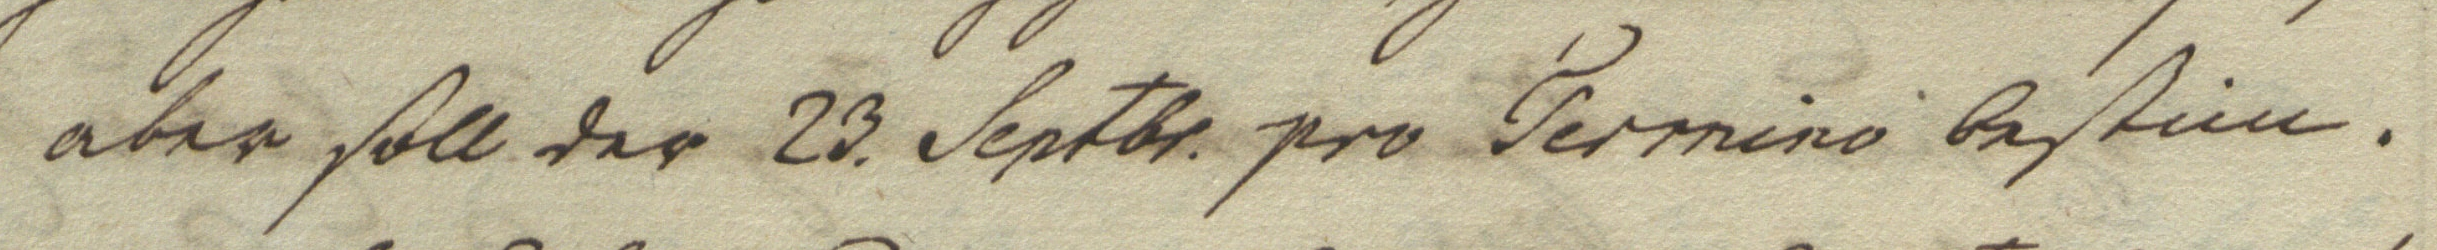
aber soll der 23. Septbr. pro Termino bestim¬
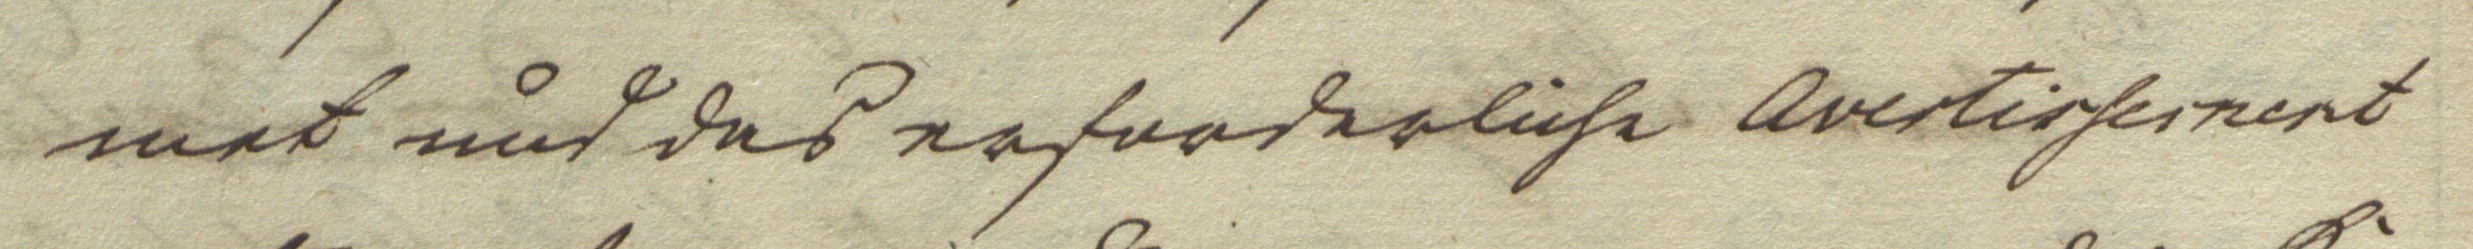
met und das erforderliche Avertissement
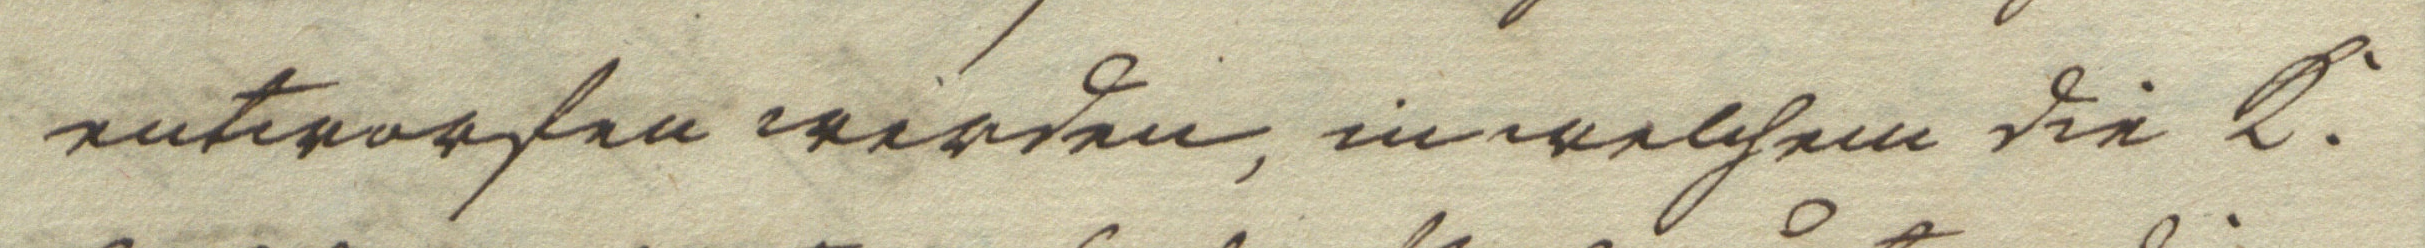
entworfen werden, in welchem die K.
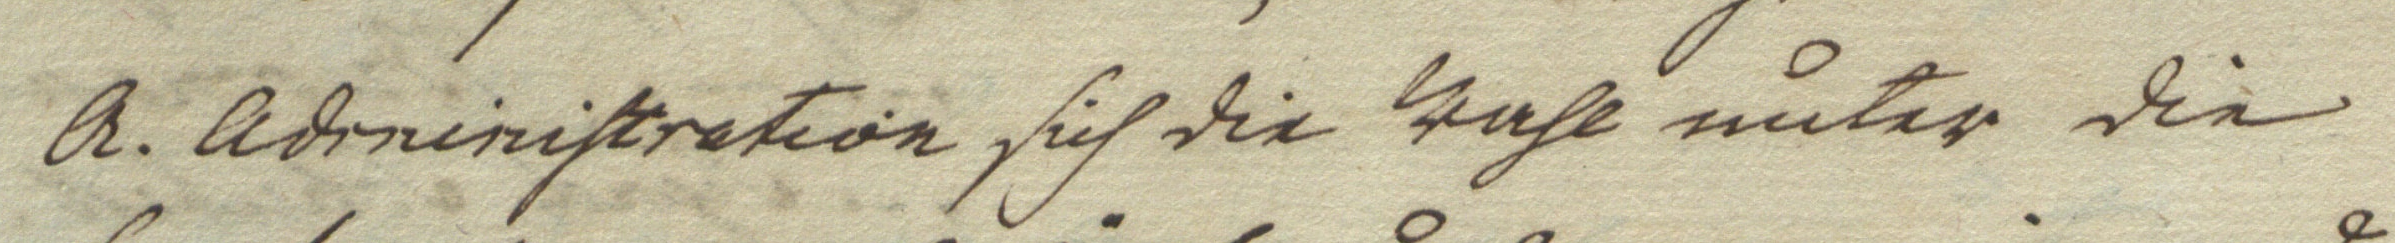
A. Administration sich die Wahl unter die
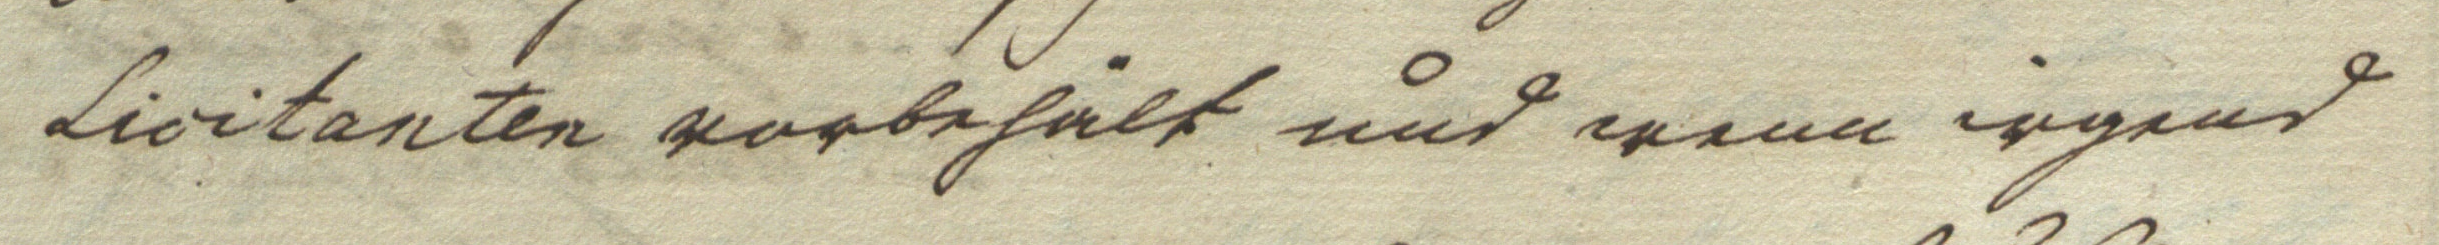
Licitanten vorbehält und wenn irgend
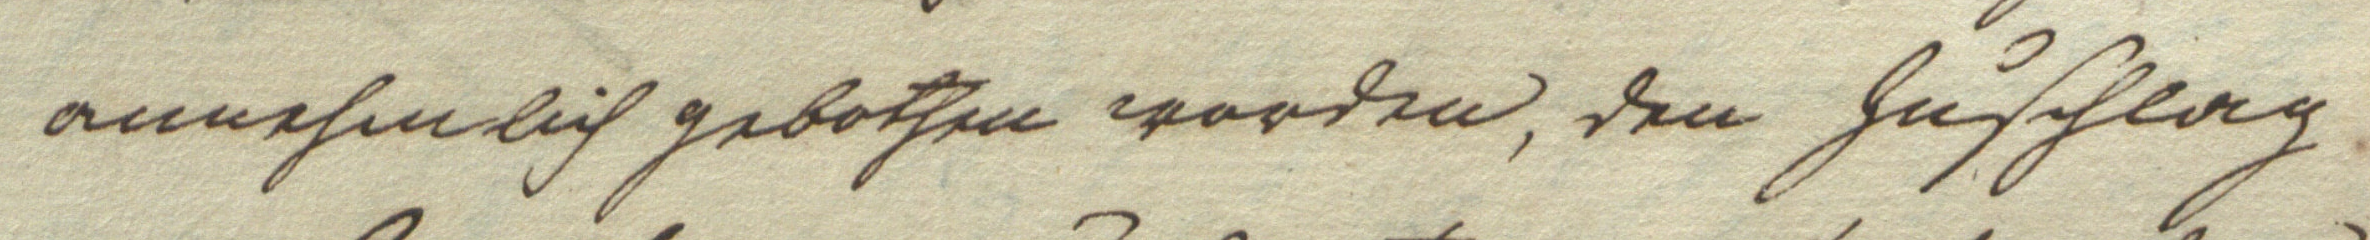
annehmlich gebothen worden, den Zuschlag
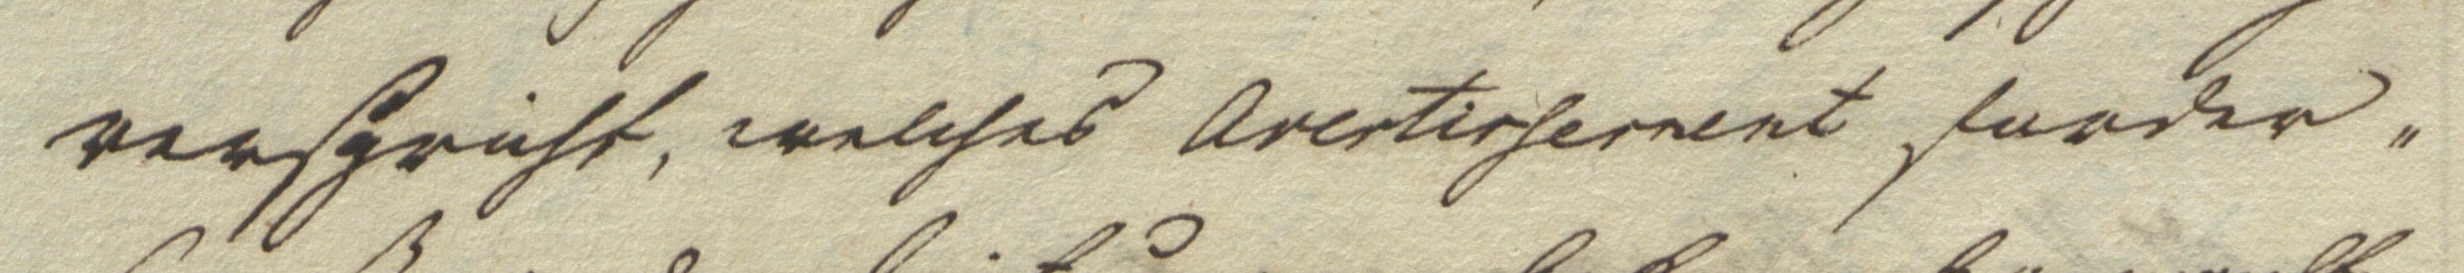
verspricht, welches Avertissement forder¬
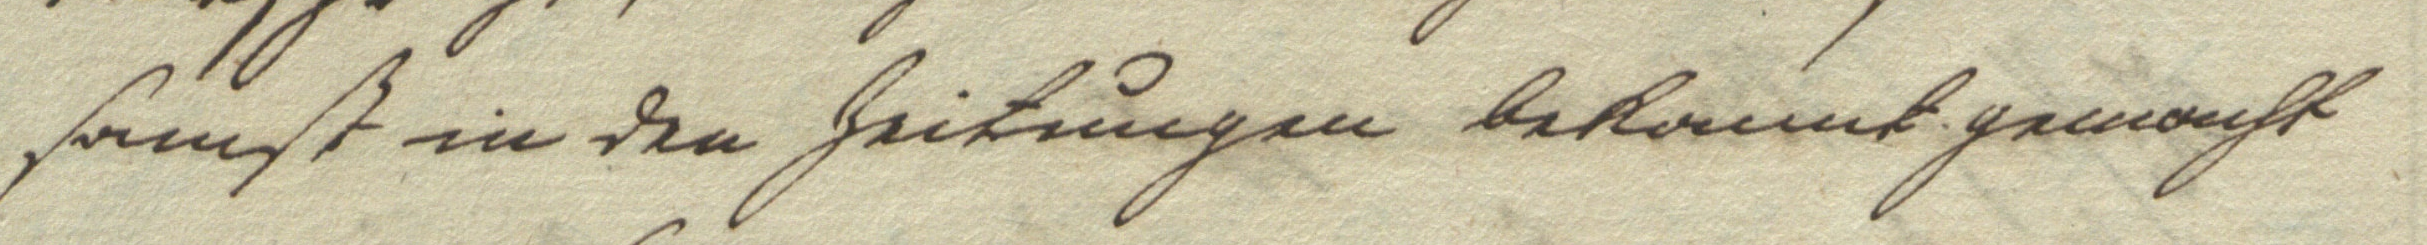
samst in den Zeitungen bekannt gemacht
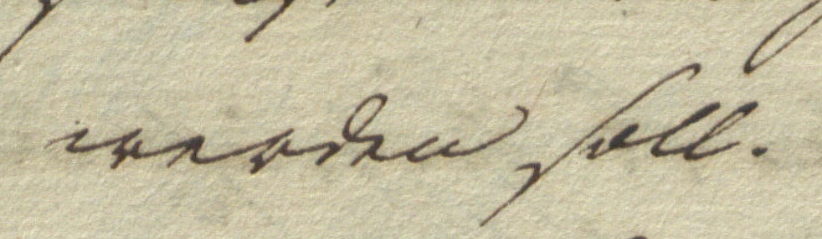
werden soll.
